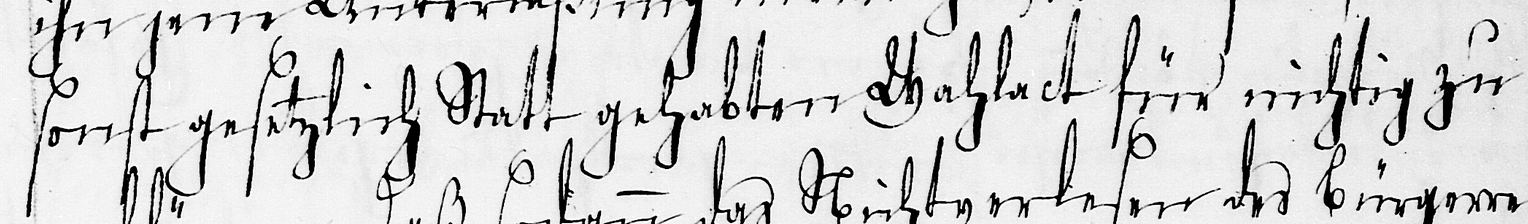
sonst gesetzlich Statt gehabten Wahlact für nichtig zu
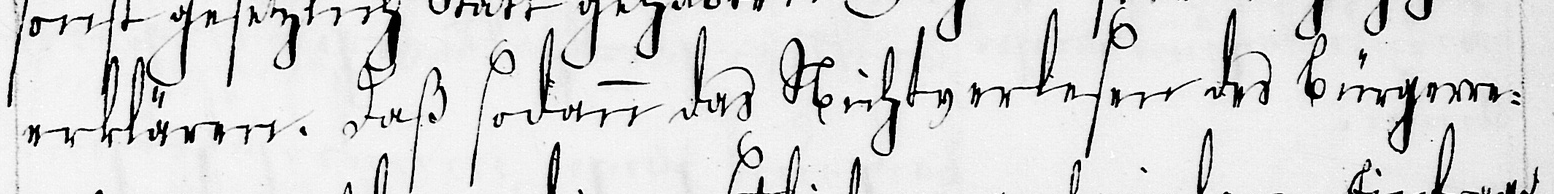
erklären. Daß sodann das Nichtverlesen des Bürgerre¬
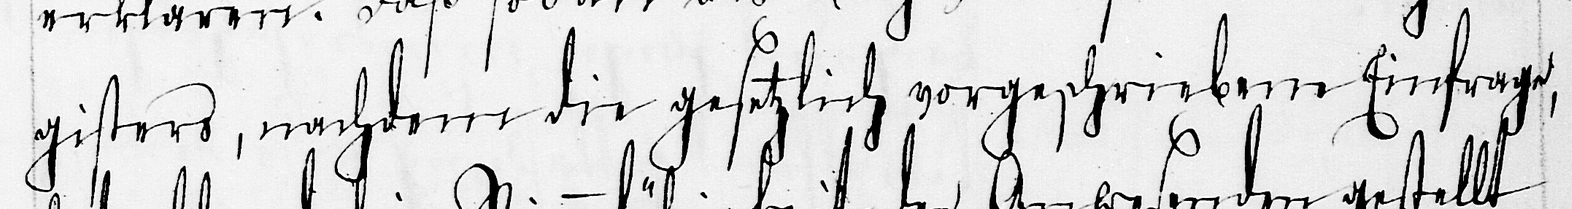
gisters, nachdem die gesetzlich vorgeschriebene Einfrage,
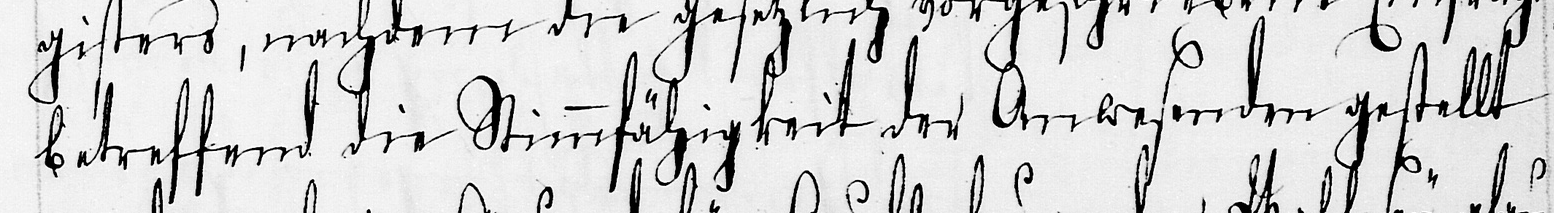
betreffend die Stimmfähigkeit der Anwesenden gestellt
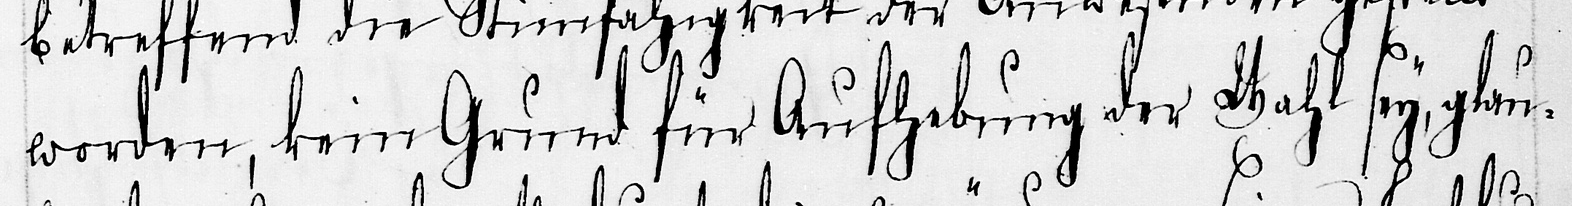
worden, kein Grund für Aufhebung der Wahl sey, gla¬
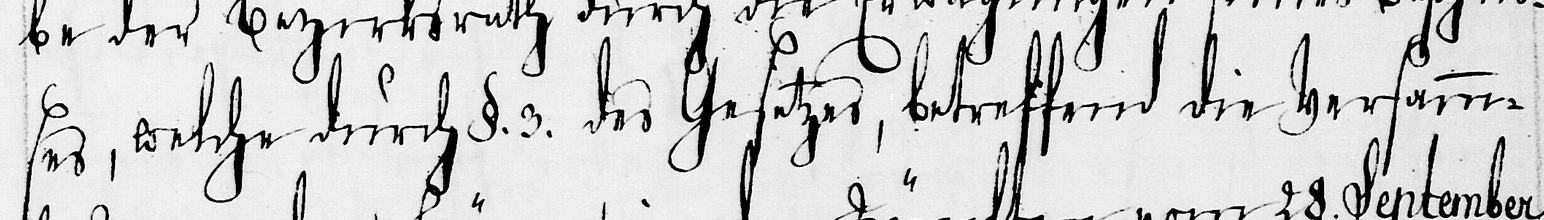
ßes, welche durch §. 3. des Gesetzes, betreffend die Versamm¬
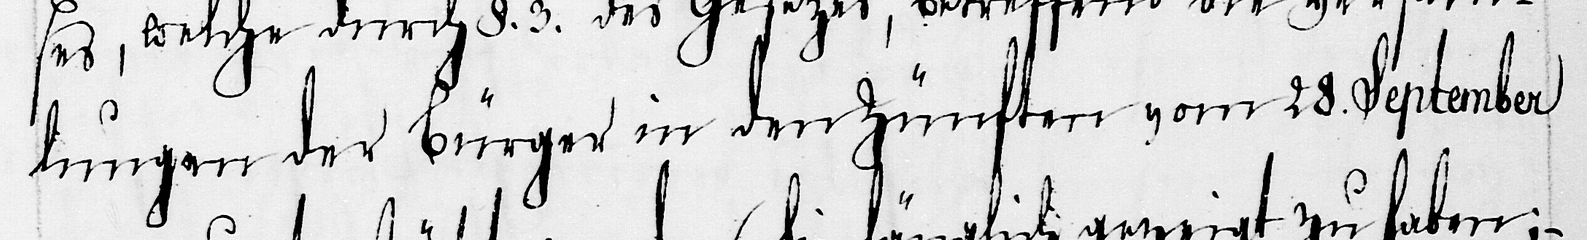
lungen der Bürger in den Zünften vom 28. September
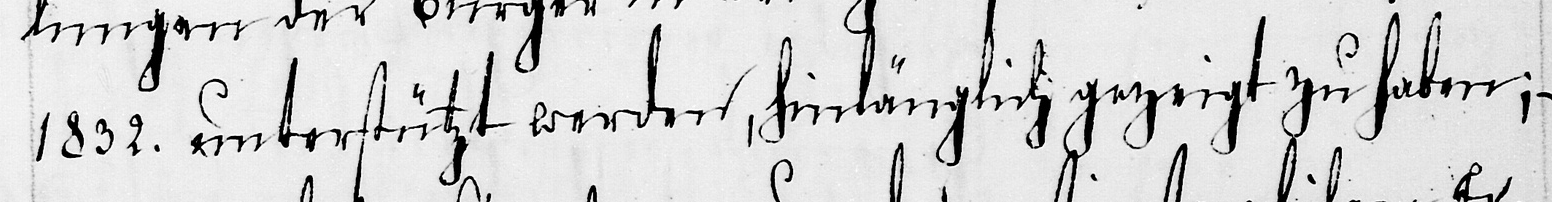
1832. unterstützt werden, hinlänglich gezeigt zu haben;
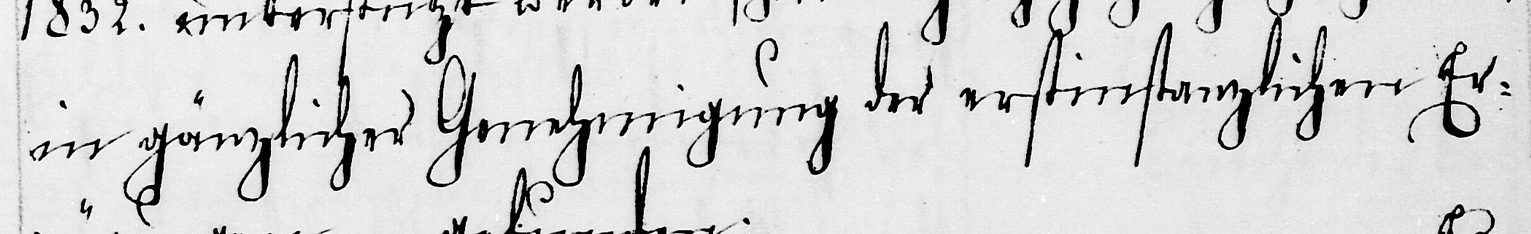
in gänzlicher Genehmigung der erstinstanzlichen Er¬
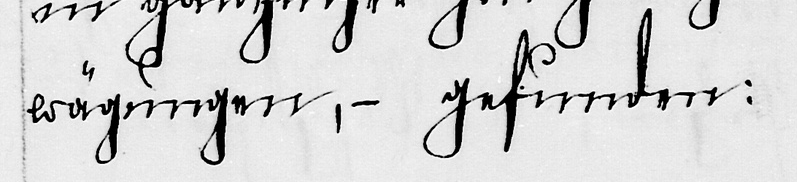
wägungen, – gefunden:
